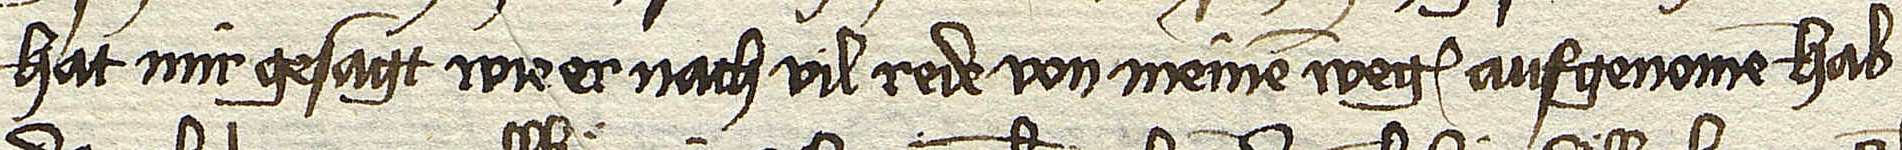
hat mir geſagt wie er nach vil rede von meine* weg* aufgenome* hab
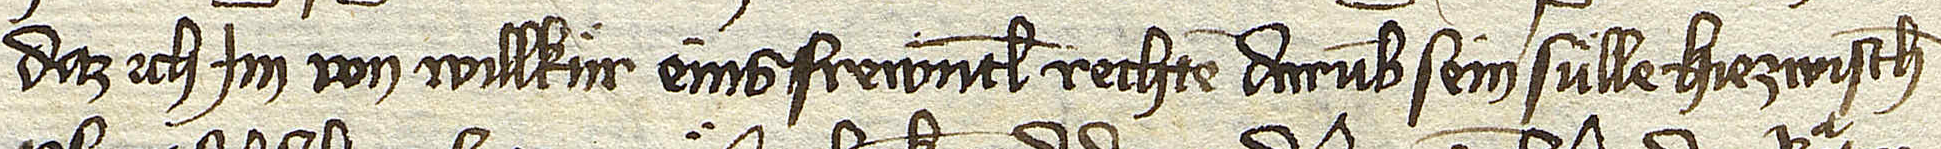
daʒ ich Im von willkür eins frewntl* rechte* daru*b ſein ſülle hieʒwiſch*
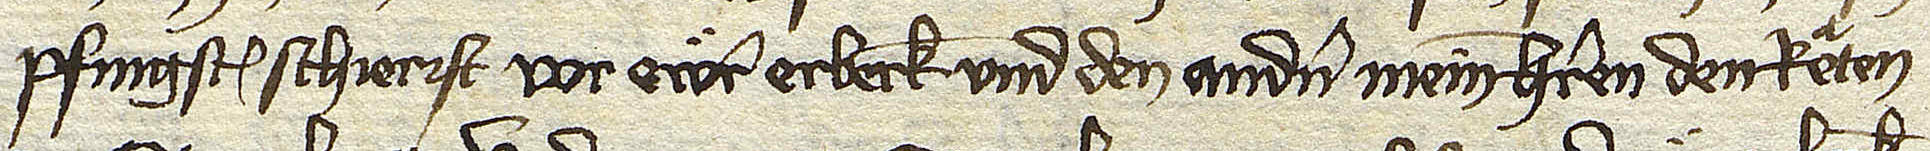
pfingſt* ſchieriſt vor ew*r erberk* vnd den and*n mein* h*ren den Rëten
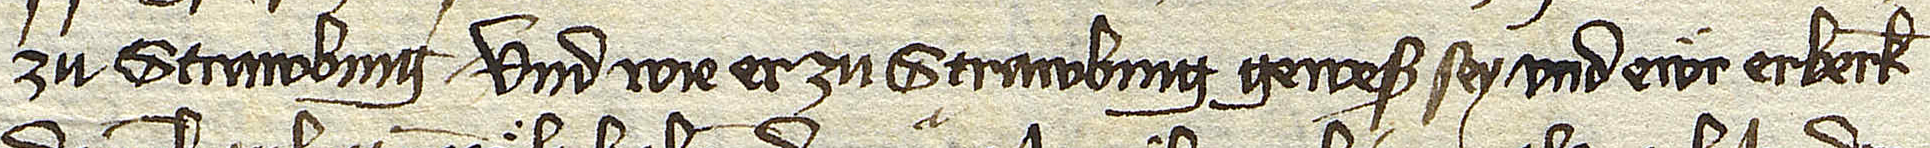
ʒu Strawbing / Vnd wie er ʒu Strawbing geweſ* ſey vnd ewr erberk*
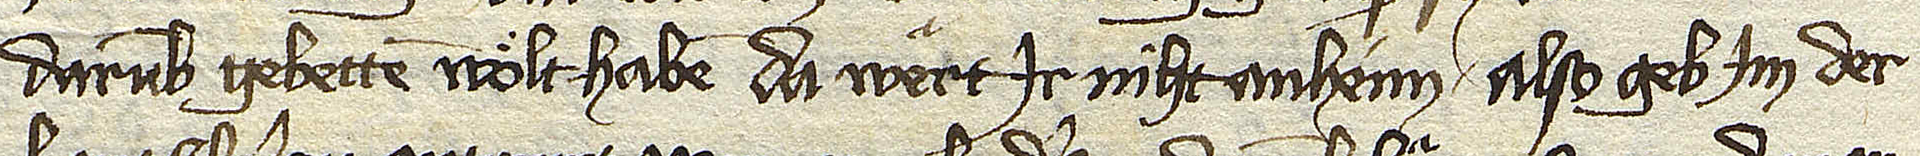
daru*b gebette* wölt habe* da wërt Ir niht anheim / Alſo geb Im der
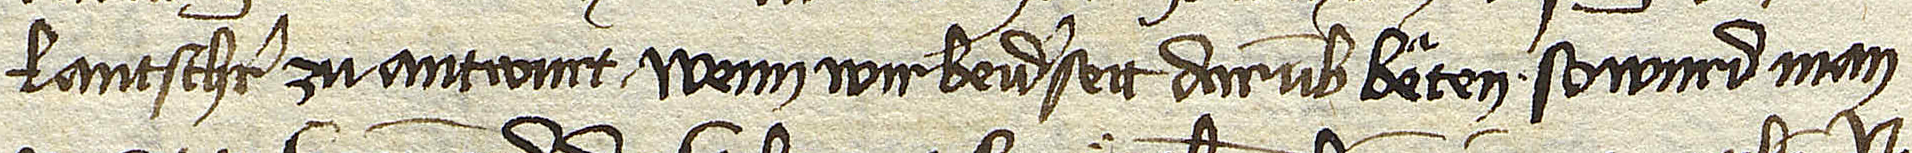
lantſchr* ʒu antwurt / Wenn wir beid*ſeit daru*b bëten . ſo wurd man
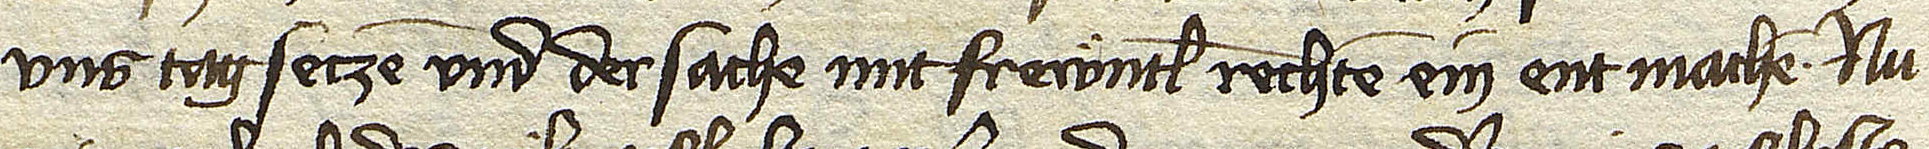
vns tag ſecʒe* vnd der ſache mit frewntl* rechte* ein ent mache* . Nu
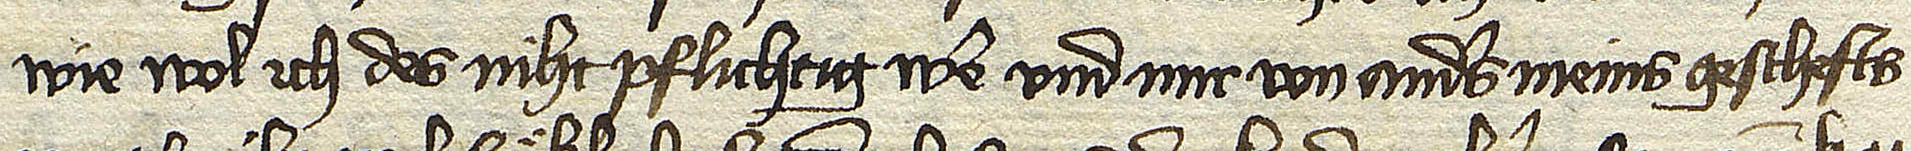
wie wol ich des niht pflichtig we* vnd mir von and*s meins geſchefts
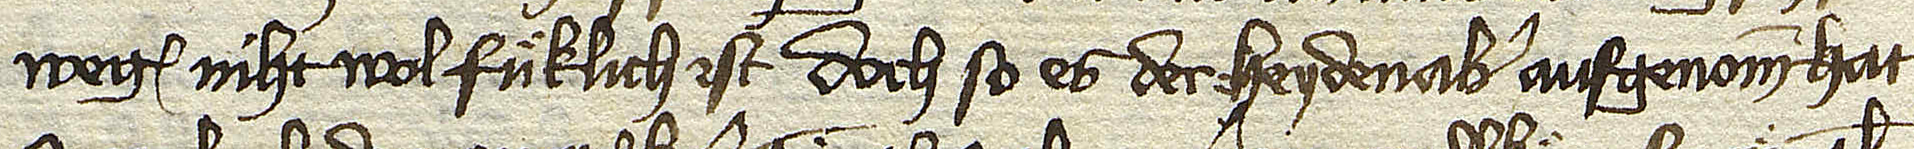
weg* niht wol füklich iſt Doch ſo es der heydenab* aufgenom* hat
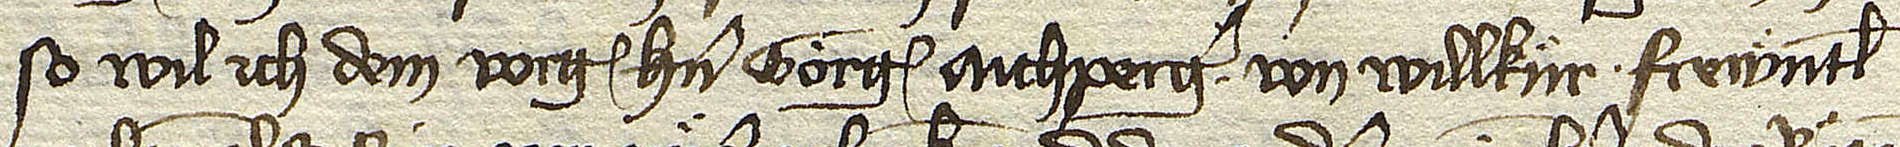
ſo wil ich dem vorg* h*n Görg* Aichperg* . von willkür . frewntl*
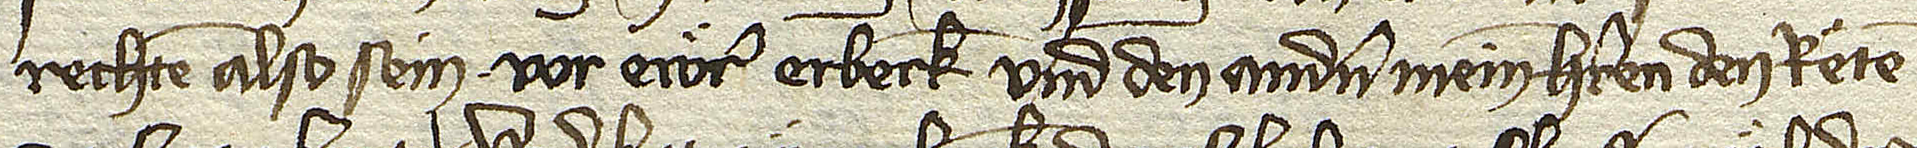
rechte* alſo ſein . vor ew*r erberk* vnd den and*n mein* h*ren den Rëte*
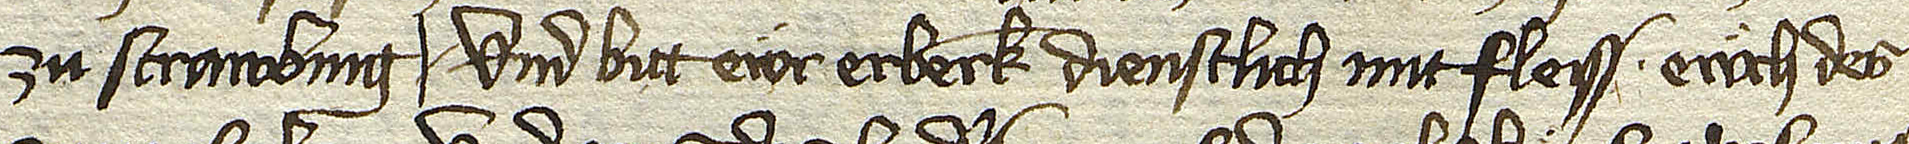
ʒu Strawbing / Vnd bitt ewr erberk* dienſtlich mit fleiſſ . ewch des
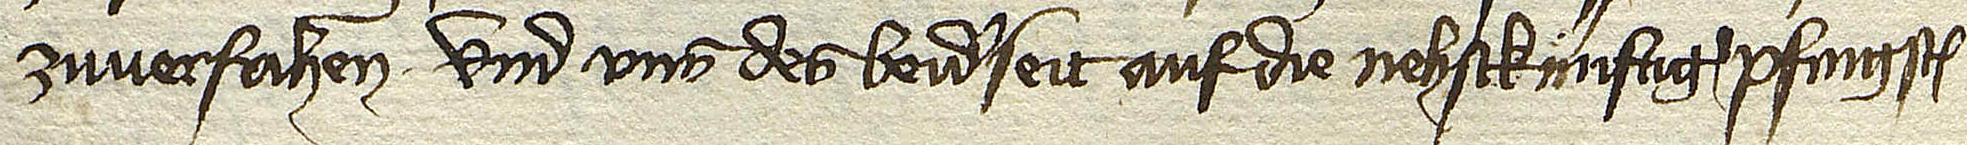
ʒuuerfahen . Vnd vns des beid*ſeit auf die nehſtkünftig* pfingſt*
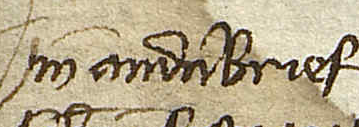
Im* and*n brief
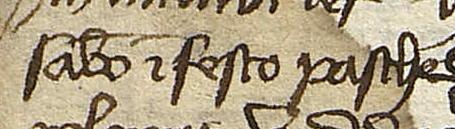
ſabo* i* feſto paſche
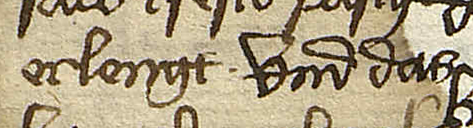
erlengt . Vnd das
